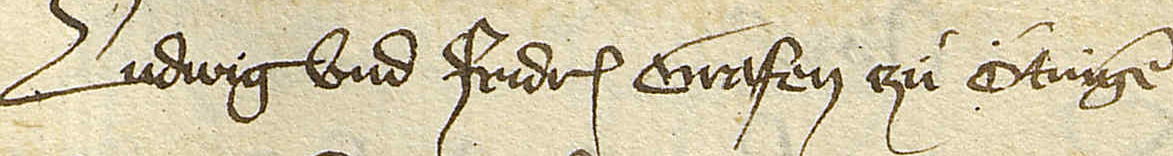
Ludwig vnd Fridr* Grafen cʒü Ötinge*
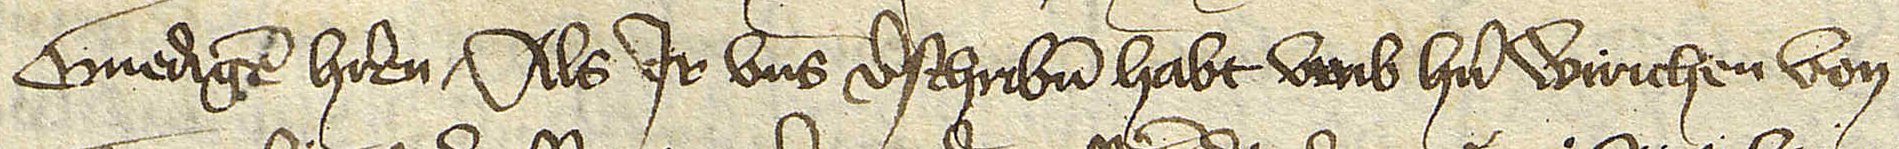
Gnedige* hr*en / Als Ir vns v*ſchribn* habt vmb hn* Wirichen von
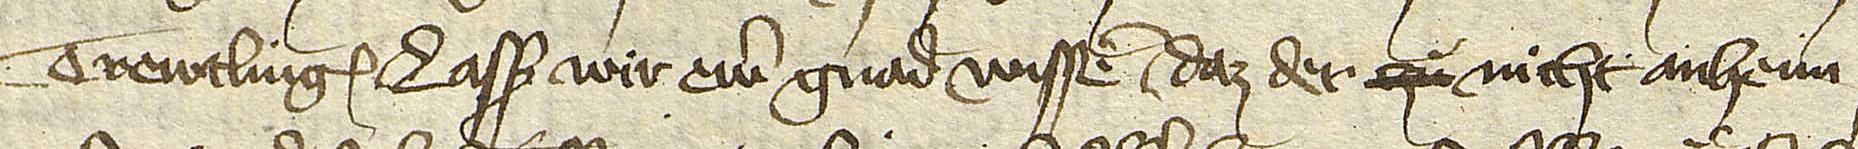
Trewtling* / Laſſ* wir ew* gnad wiſſe* / daʒ der cʒü nicht anheim
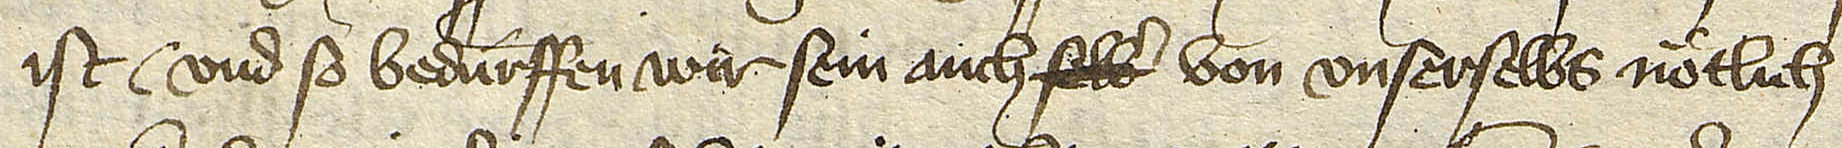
iſt / vnd ſo bedürffen wir ſein auch ſelb* von vnſerſelbs nötlich*
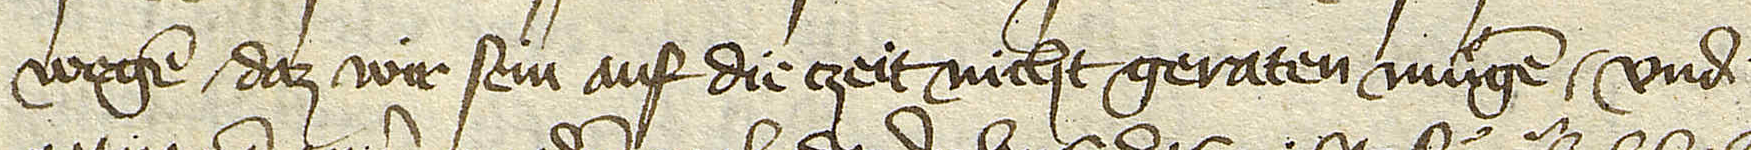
wege* / daʒ wir ſein auf die cʒeit nicht geraten müge*/ vnd
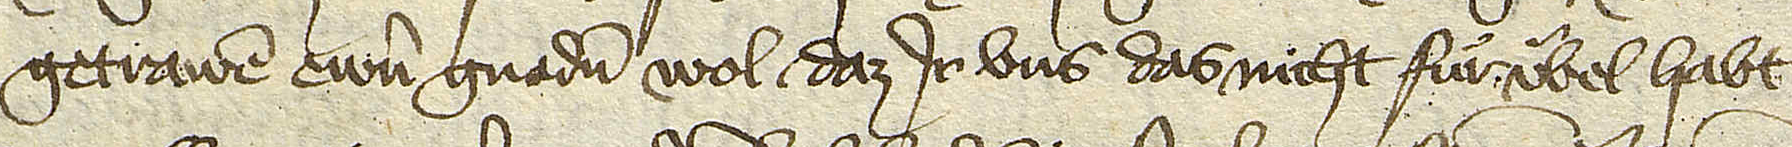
getrawe* ewn* gnadn* wol / daʒ Ir v ns das nicht für v̈bel habt
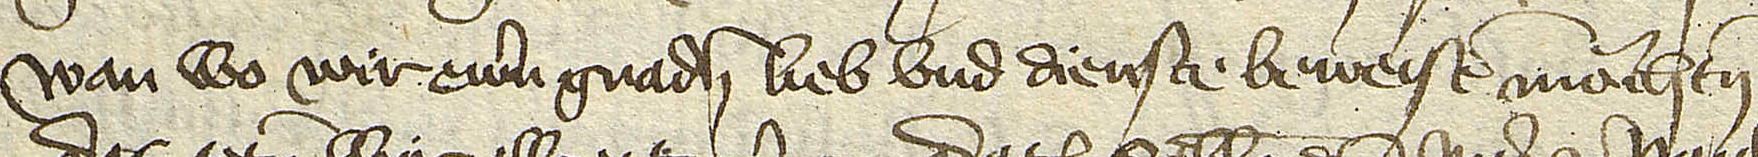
wan wo wir ewn* gnadn* lieb vnd dienſte beweiſe* möchtn*
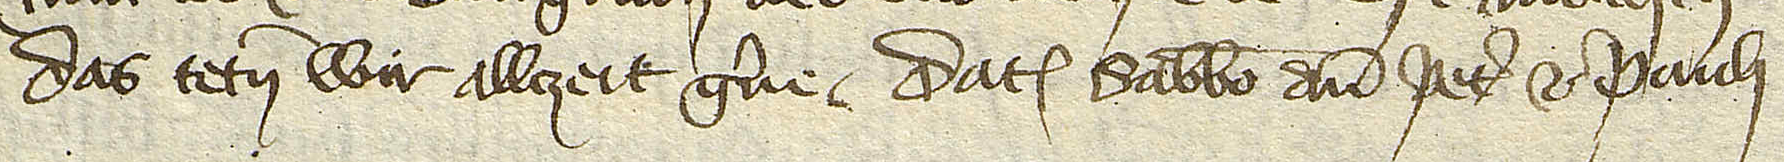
Das tetn* wir allcʒeit g*ne / Dat* Sabbo* an* Pet* @ Pauli
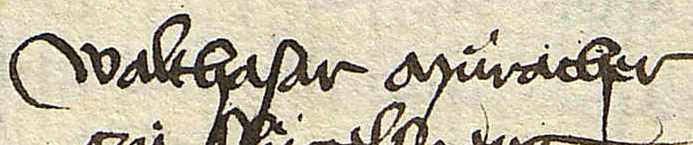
walthaſar Müracher
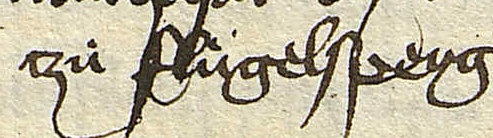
cʒu flügelſperg
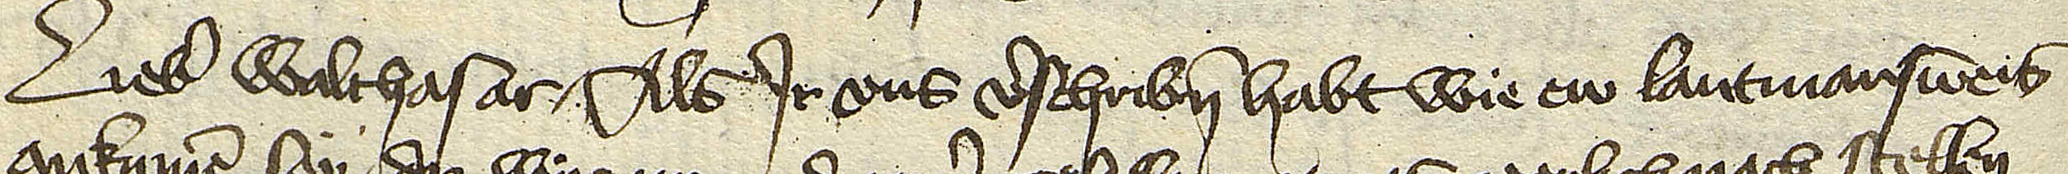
Lieb* walthaſar / Als Ir vns v*ſchribn* habt wie ew lantmanſweis
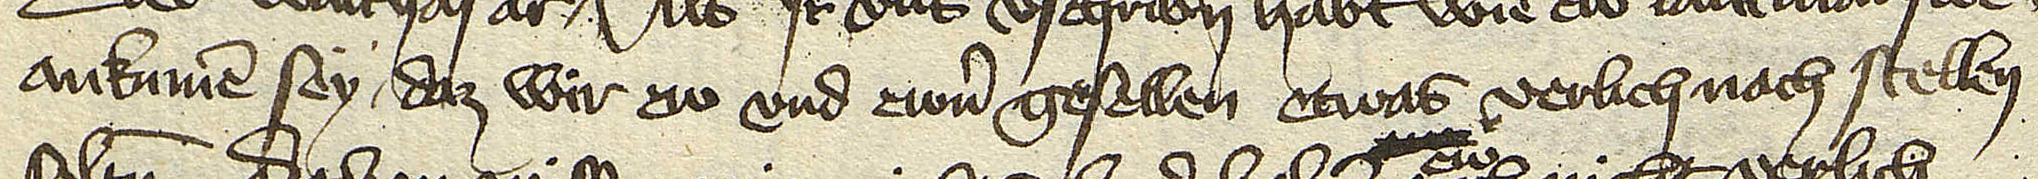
ankume* ſey / daʒ wir ew vnd ewn* geſellen etwas verlich nach ſtellen
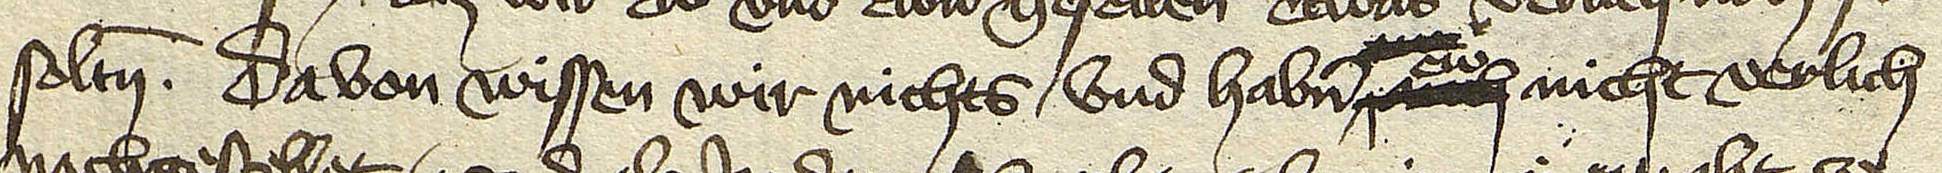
ſoltn* . Davon wiſſen wir nichts / vnd habn* auch nicht verlich
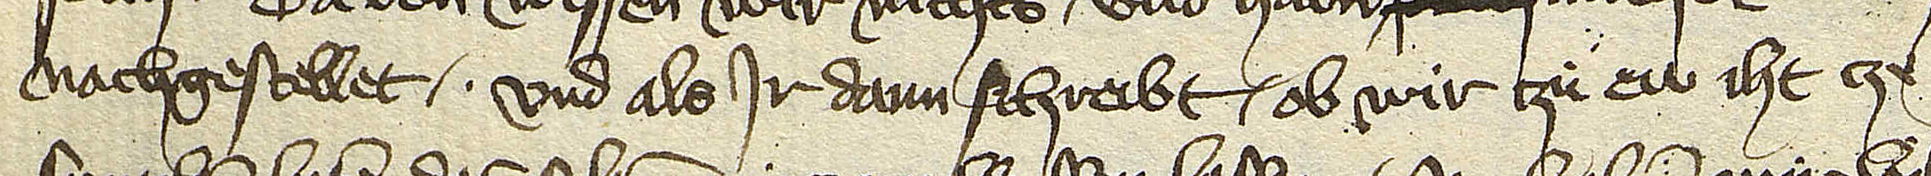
nachgeſtellet / . vnd als Ir dann ſchreibt / ob wie cʒü ew ihr cʒe
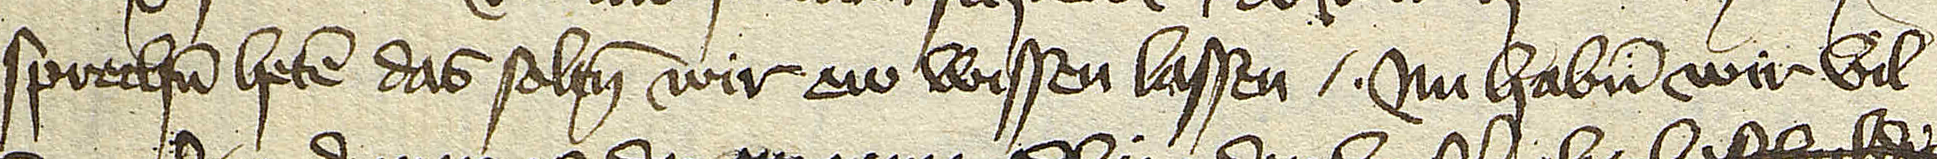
ſprechn* hete* das ſoltn* wir ew wiſſen laſſen / . Nu habn* wir vil
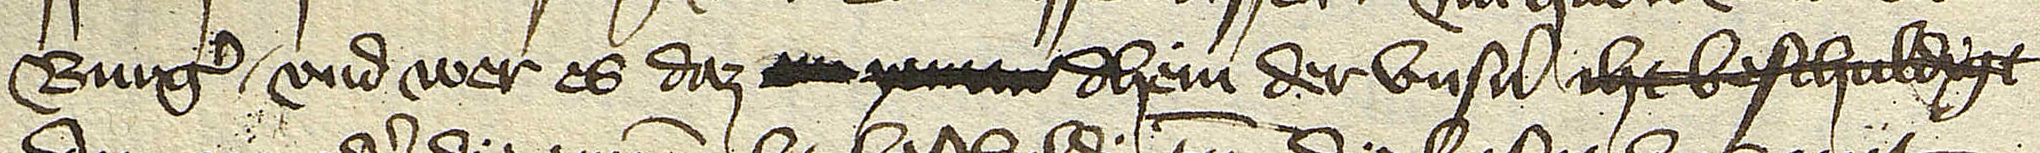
Burg* / vnd wer es daʒ %% yeman dheim der vnſn* iht beſchuldigt
